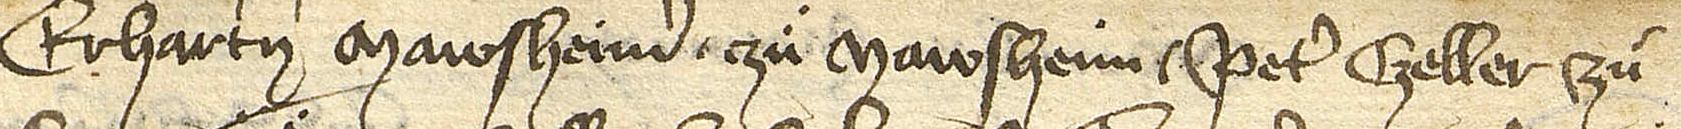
Erhartn* Mawſheim* cʒü Mawſheim / Pet* Cʒeller cʒü
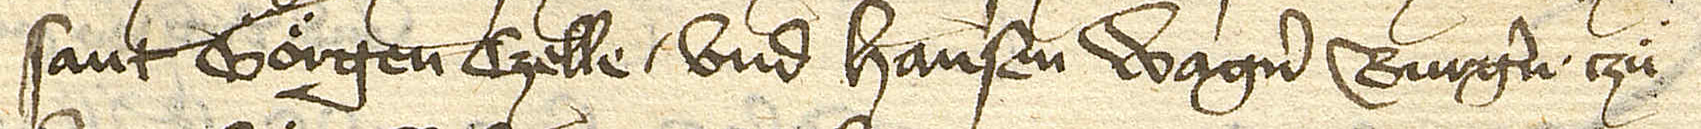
ſant Görgen Cʒelle / vnd hanſen Wagn* Burg*n cʒü
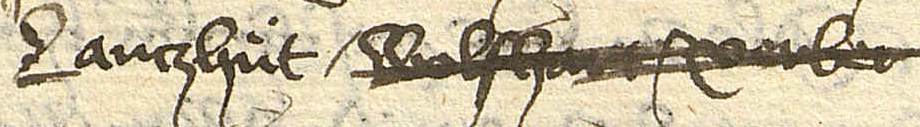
Lancʒhüt / Wolfhart* Verber
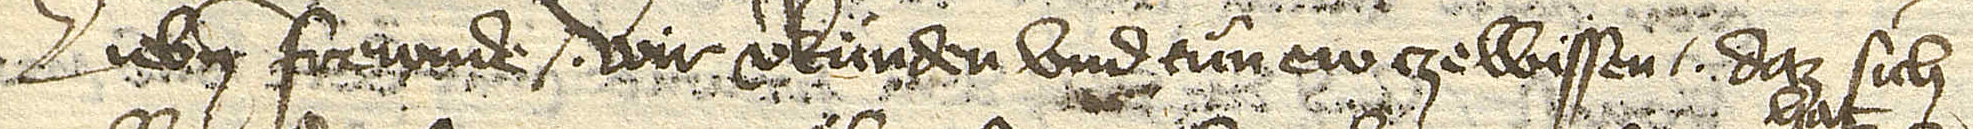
Liebn* frewnde / . Wir v*künden vnd tün ew cʒewiſſen / . daʒ ſich
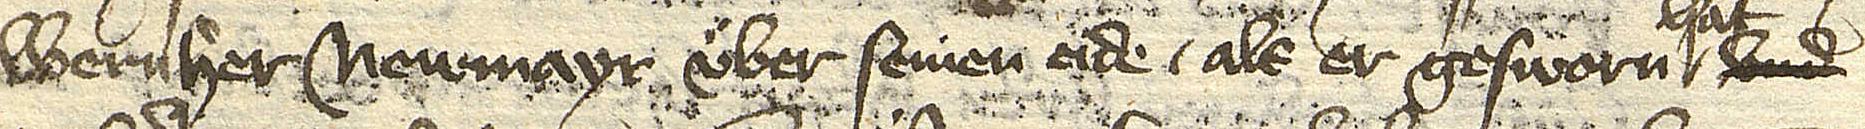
Wernher Newmayr v̈ber ſeinen eide / als er geſworn / vnd
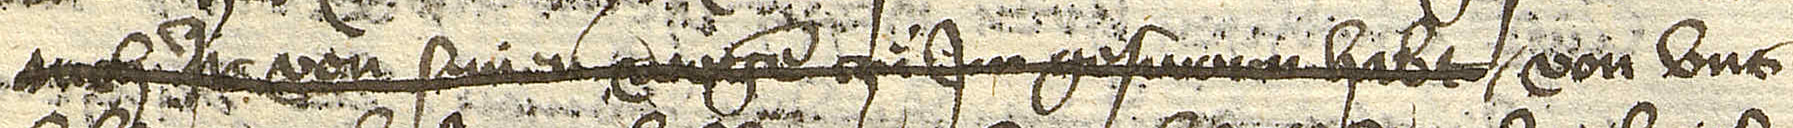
auch Ir von ſeinen wege* cʒü Im geſworn habt / von vns
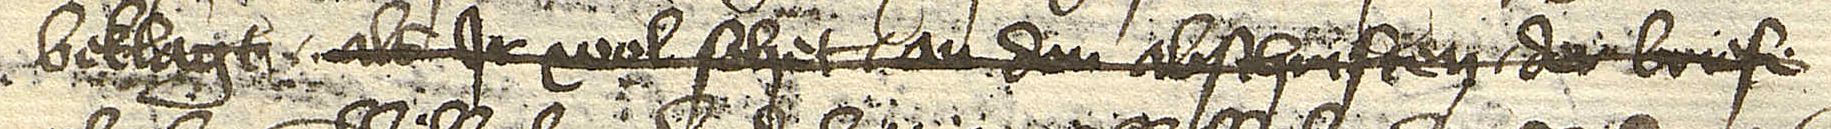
beklagt / als Ir wol ſehet / an den abſchriften / der briefe
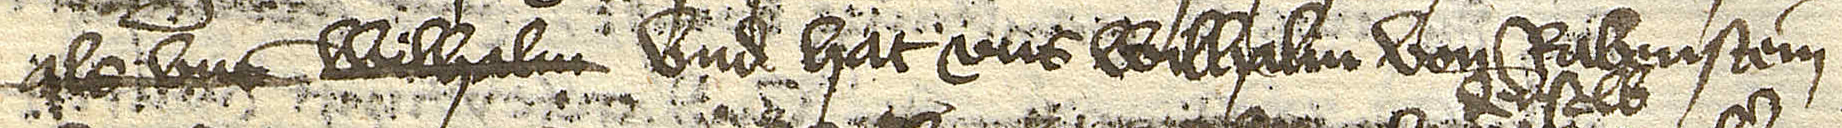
als vns Wilhalm vnd hat vns Wilhalm von Rabenſtein
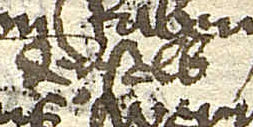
derſelb
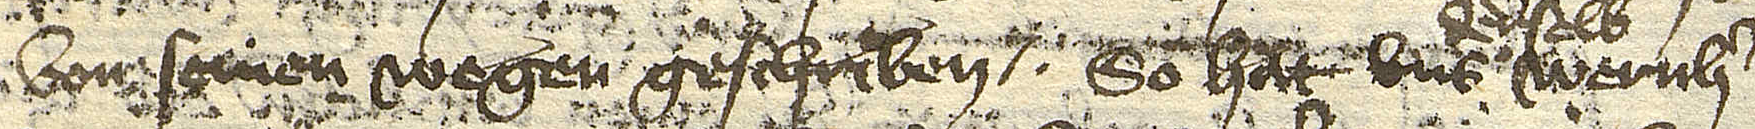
von ſeinen wegen geſchriben / . So hat vns wernh*
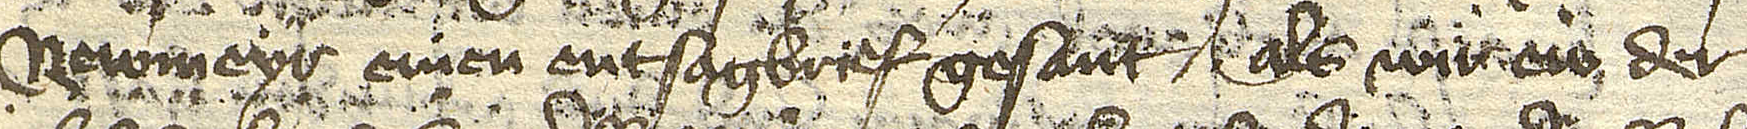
Newmeyr einen entſagbrief geſant / . als wir ew der
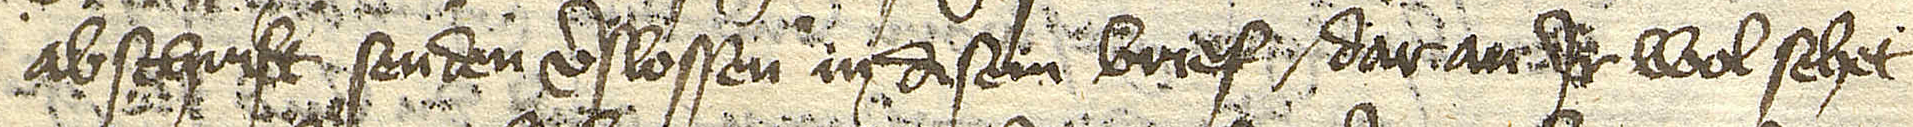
abſchrift ſenden v*ſloſſen in diſem brief / daran Ir wol ſehet
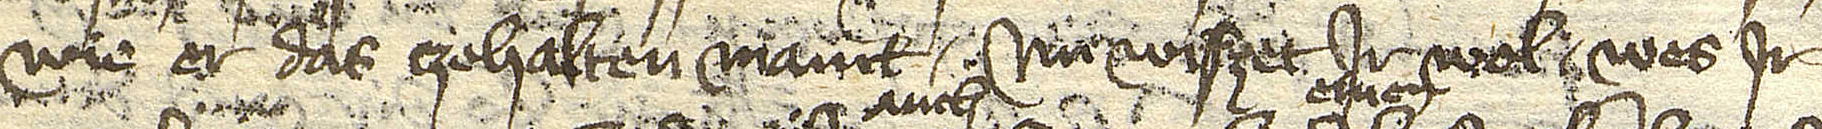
wie er das cʒehalten maint / . Nu wiſʒet Ir wol / wes Ir
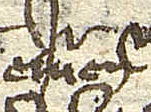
einen
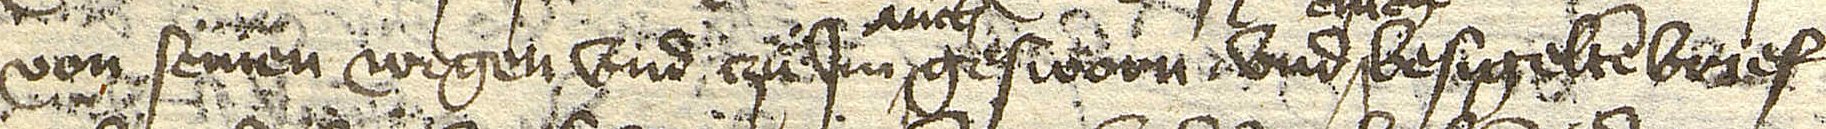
von ſeinen wegen vnd cʒü Im geſworn / vnd beſigelte* brief
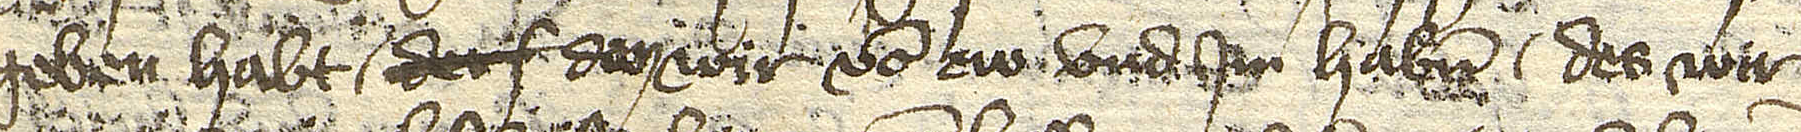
geben habt / derſ den wir vo* ew vnd Im habn* / des wir
